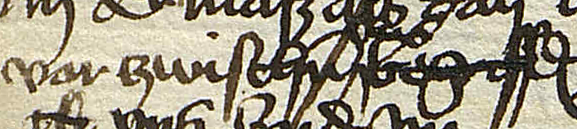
vor cʒwiſchn* begriffe*
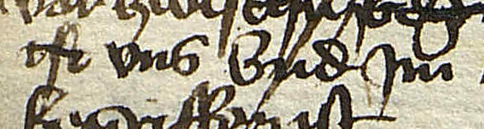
iſt vns vnd Im
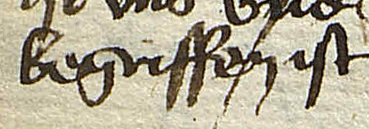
begriffen iſt
